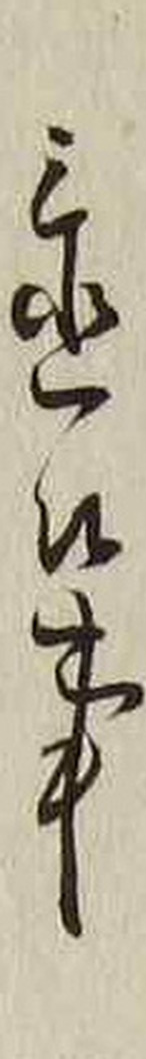置候事
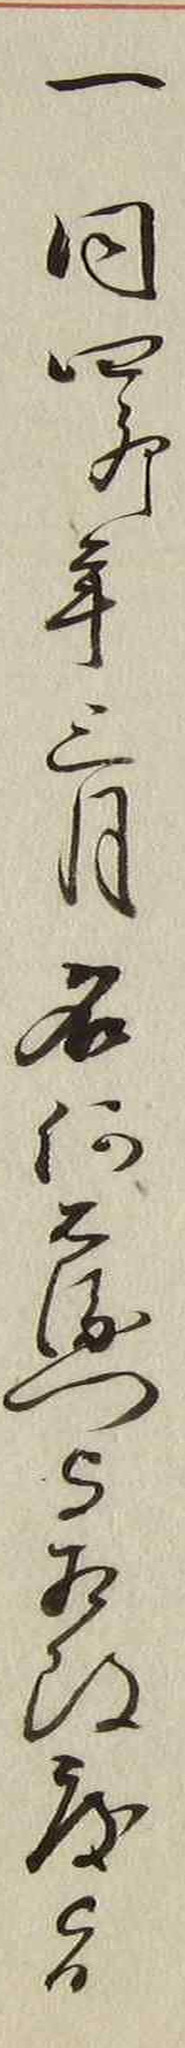一同四卯年三月名何右衛門与相改度旨
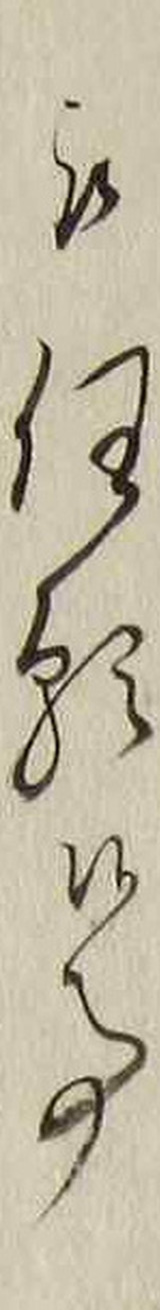被任願候事
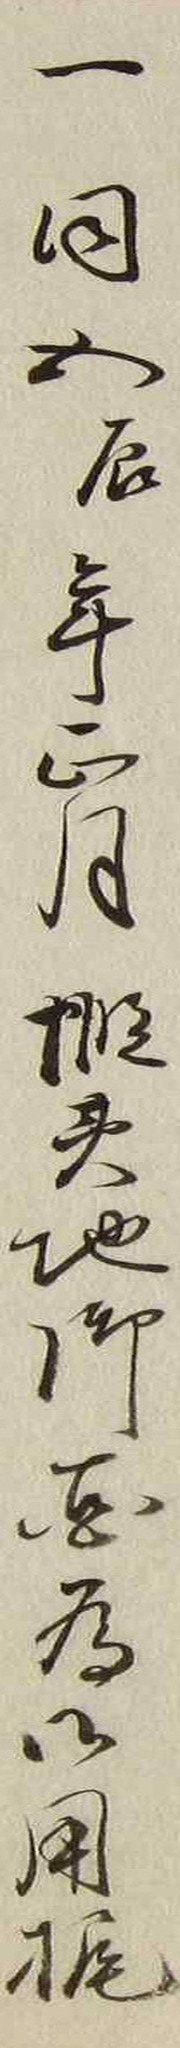一同五辰年正月蝦夷地御固為御用梶
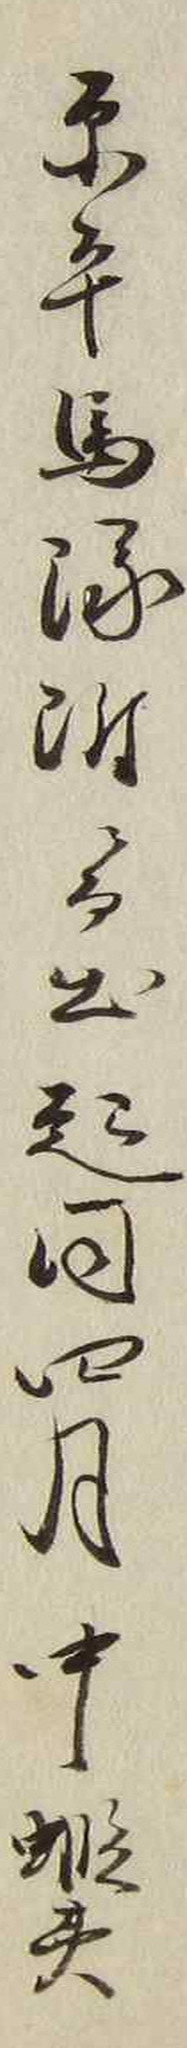原平馬隊附ニ而出起同四月中蝦夷
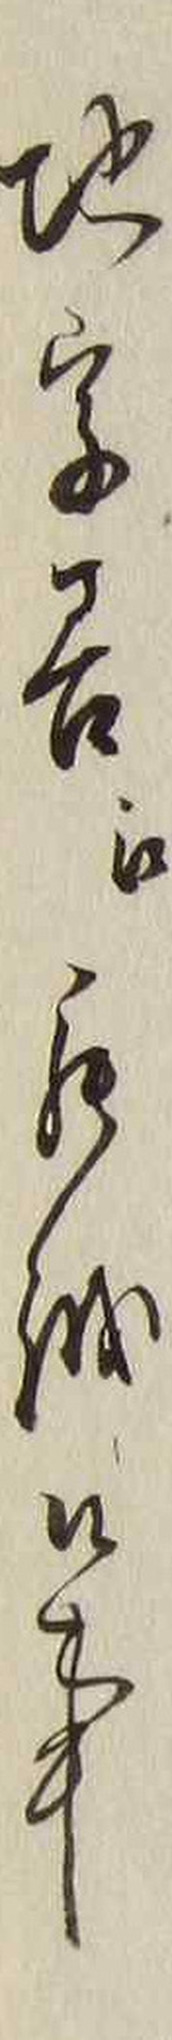地宗谷江罷越候事

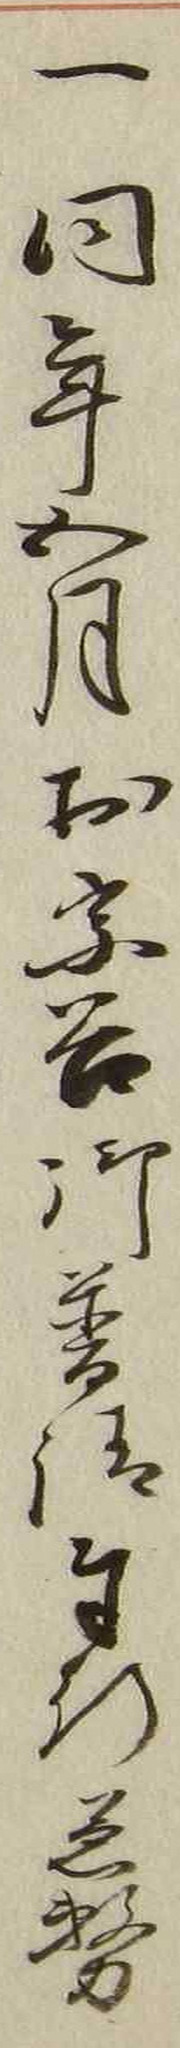一同年五月於宗谷御普請奉行兼務
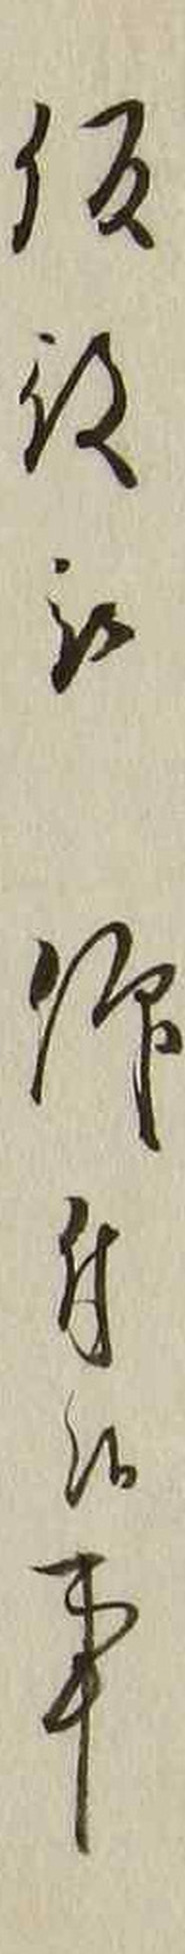仮役被仰付候事
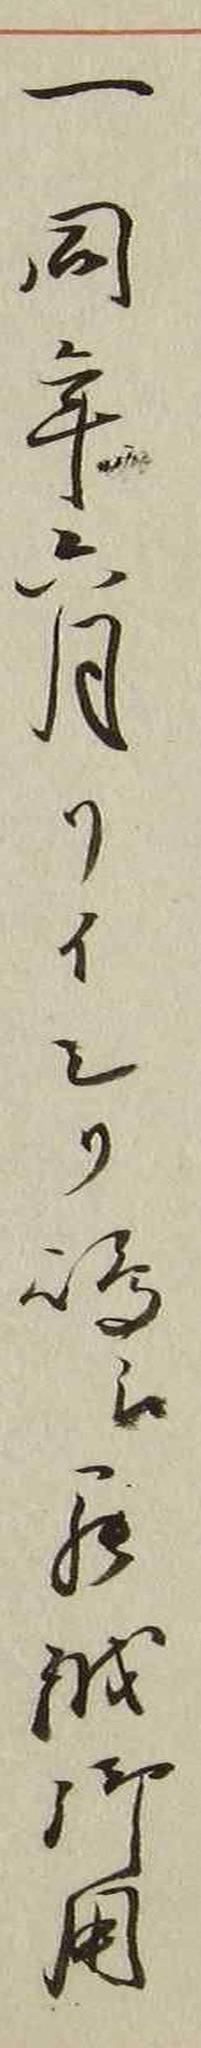一同年六月リイシリ島江罷越御用
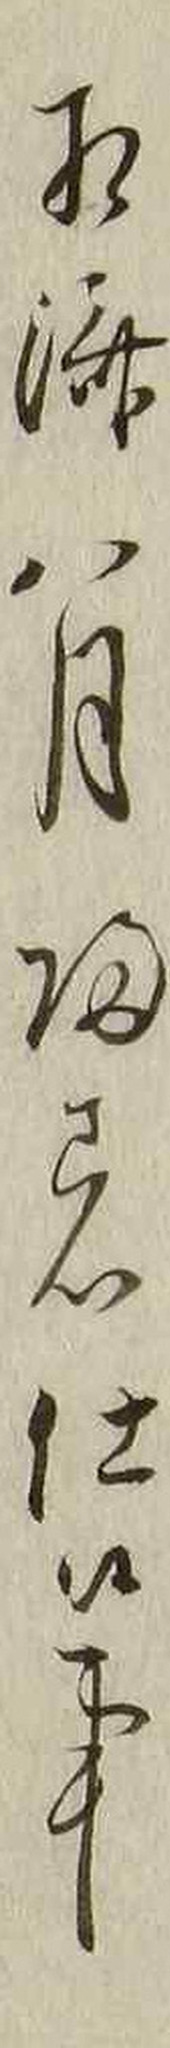相済八月帰着仕候事
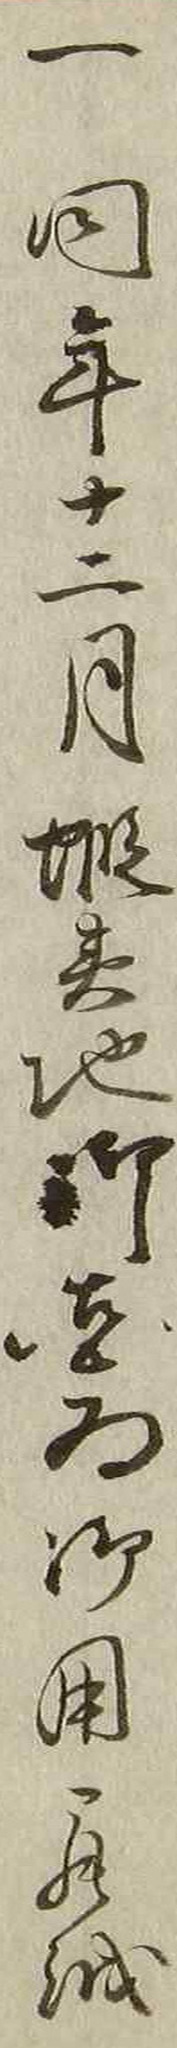一同年十二月蝦夷地御固為御用罷越
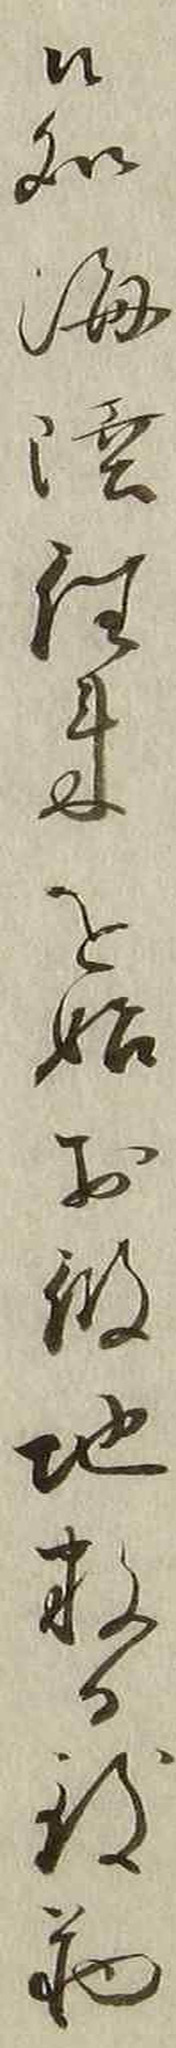候処海陸往来を始於彼地数日致勤
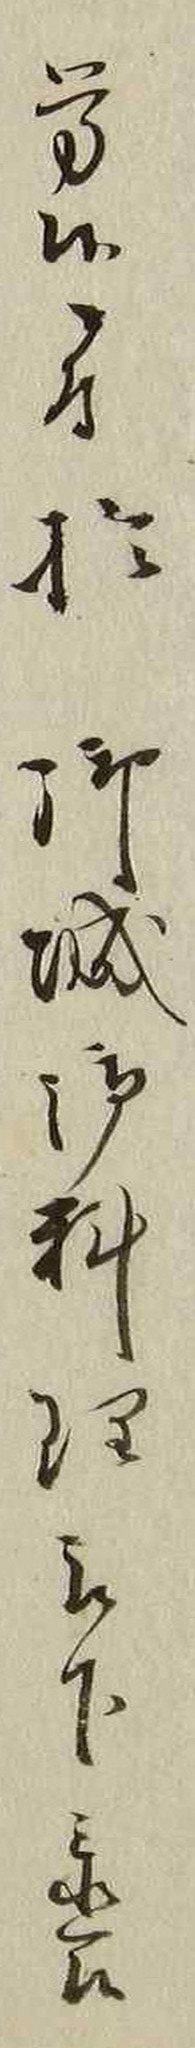労候ニ付於御城御料理被下置候
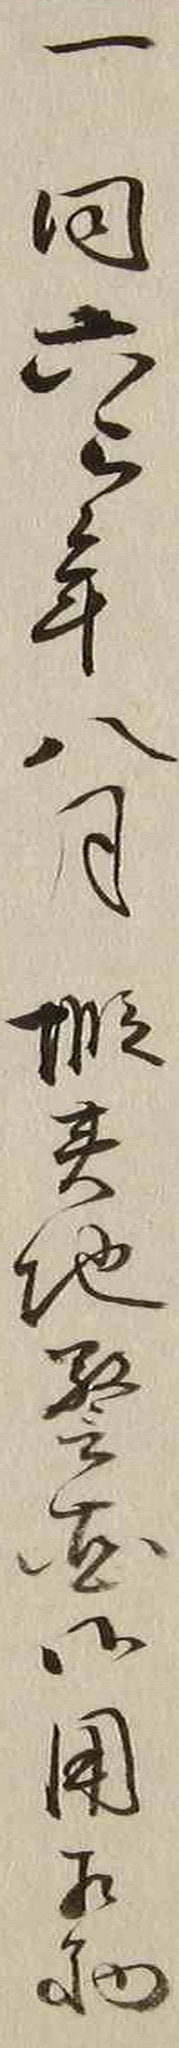一同六巳年八月蝦夷地警固御用相勤
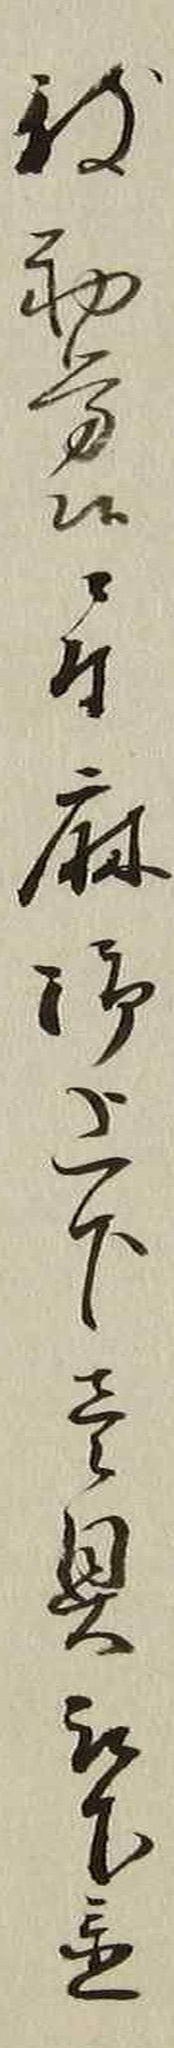致勤労候ニ付麻御上下壱具被下置
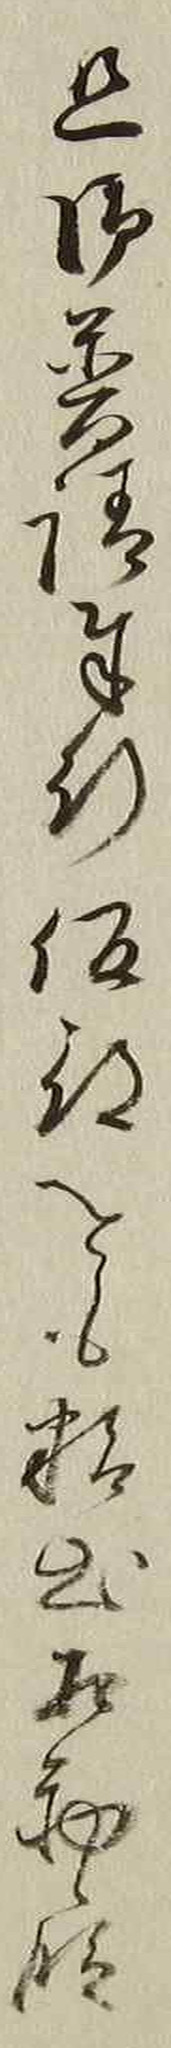旦御普請奉行仮役をも精出相勤候段
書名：諸士系譜　巻之25　い之部25
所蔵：会津若松市立会津図書館
